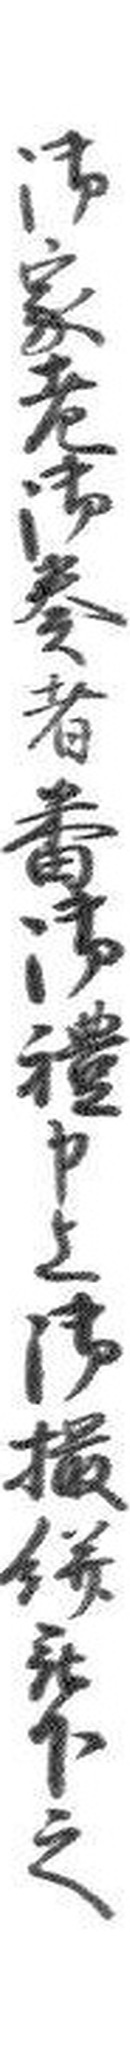御家老御奏者番御礼申上御撮絣被下之
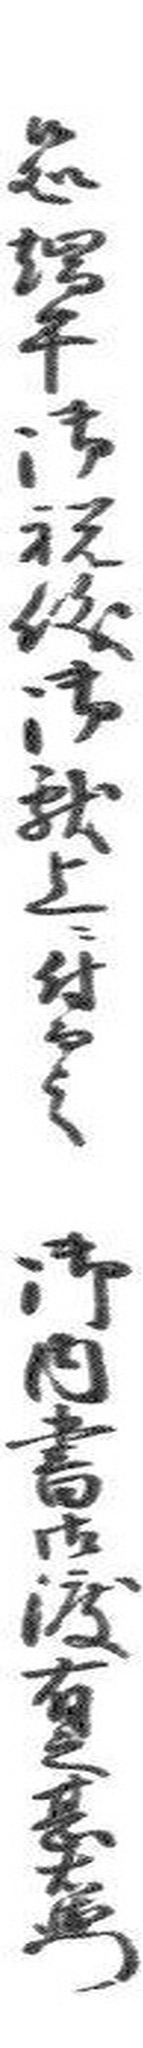候処端午御祝儀御献上ニ付而之御内書御渡有之甚右衛門
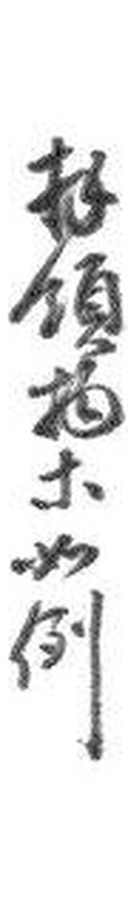拝領物等如例
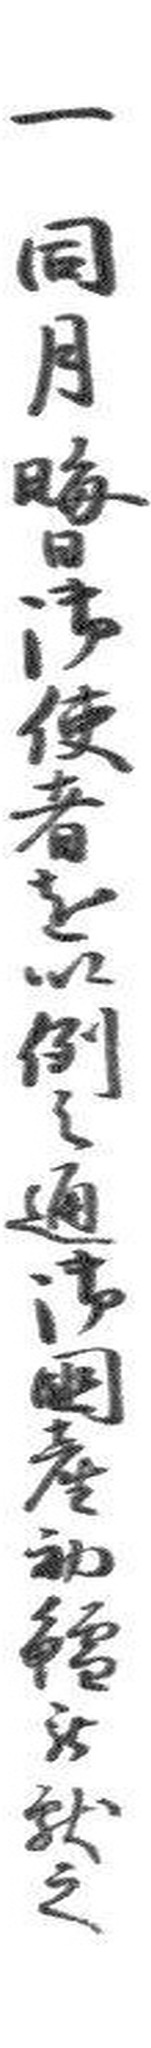一同月晦日御使者を以例之通御国産初鱈被献之
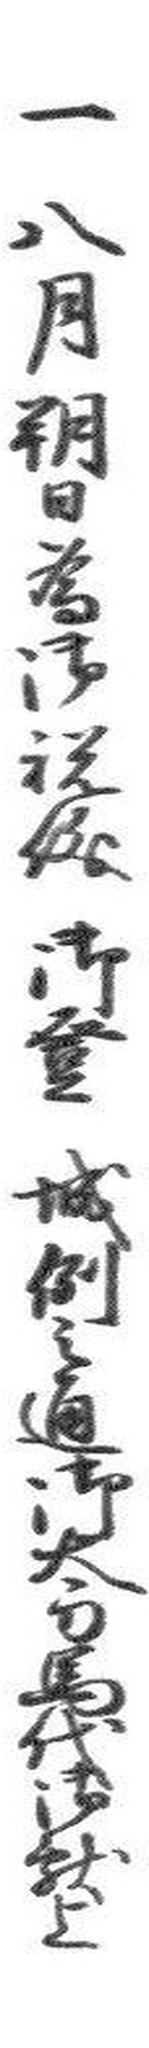一八月朔日為御祝儀御登城例之通御太刀馬代御献上

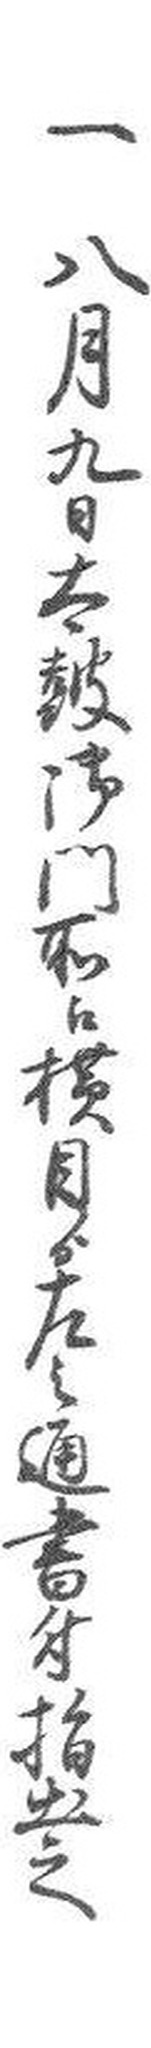一八月九日太鼓御門所江横目ゟ左之通書付指出之
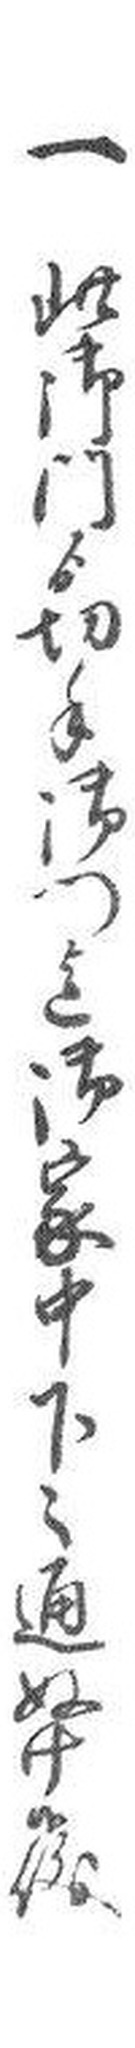一此御門ゟ切手御門迄御家中下々通ぬけ候儀
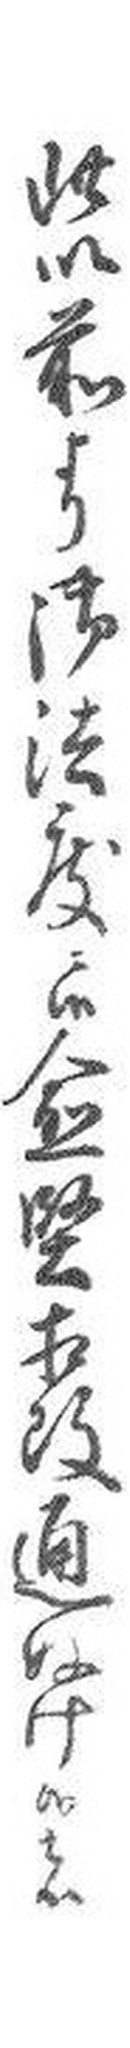此以前より御法度ニ候愈堅相改通ぬけ候者
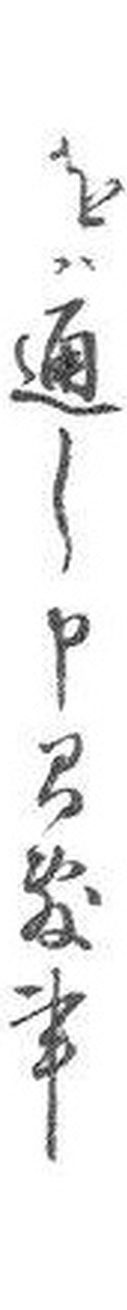をㇵ通し申間敷事
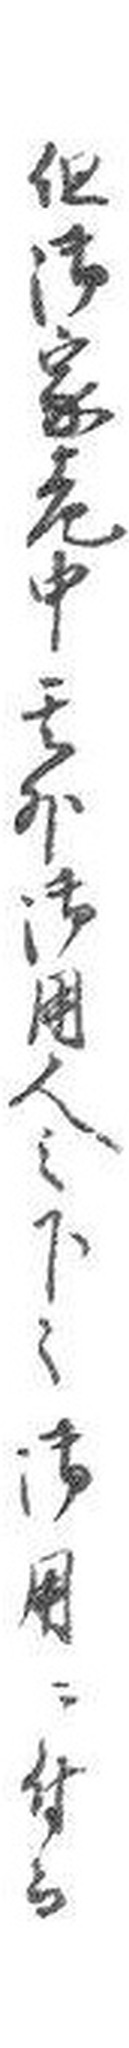但御家老中其外御用人之下々御用ニ付而
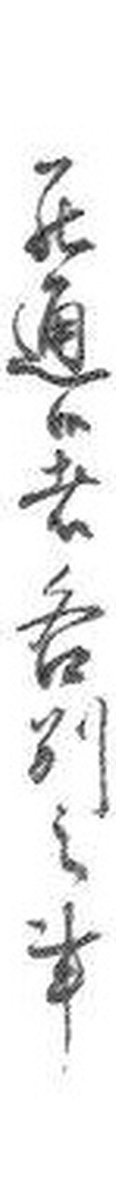罷通候者各別之事
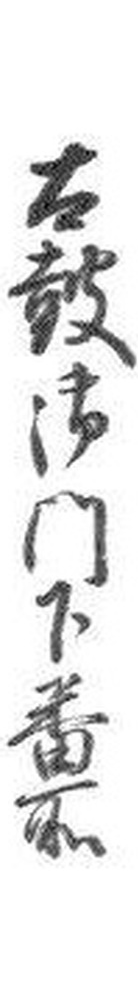太鼓御門下番所
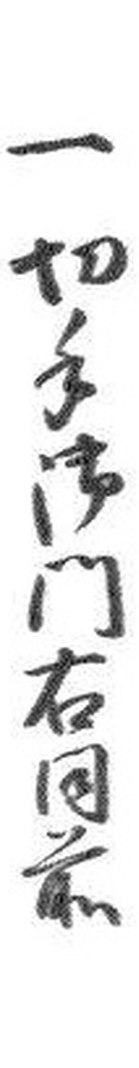一切手御門右同然
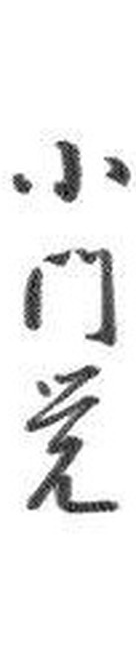小門覚
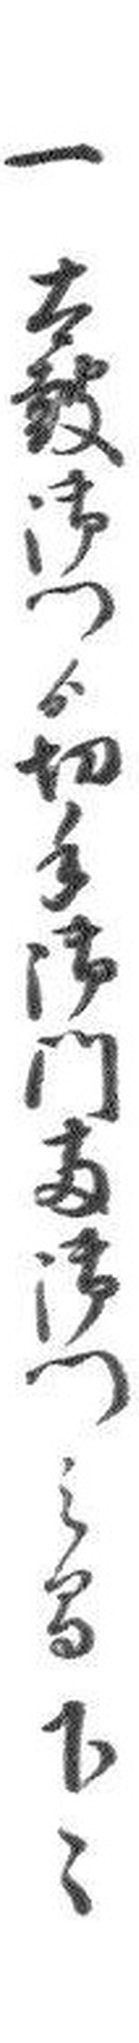一太鼓御門ゟ切手御門両門之間下々
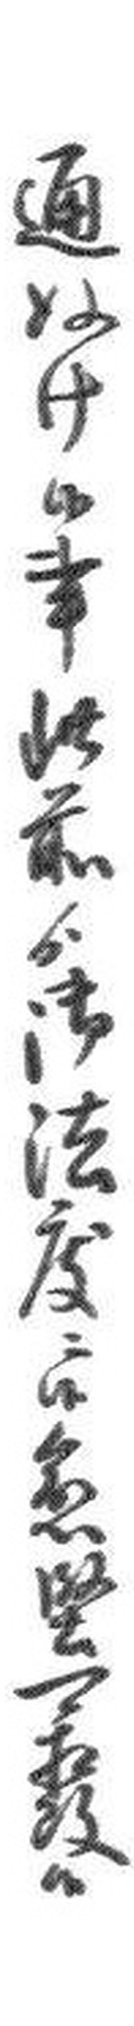通ぬけ候事此前ゟ御法度ニ候愈堅可相改候
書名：家譜 七 光通公 従寛文四年到同九年
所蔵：福井県文書館 Fukui Prefectural Archives
